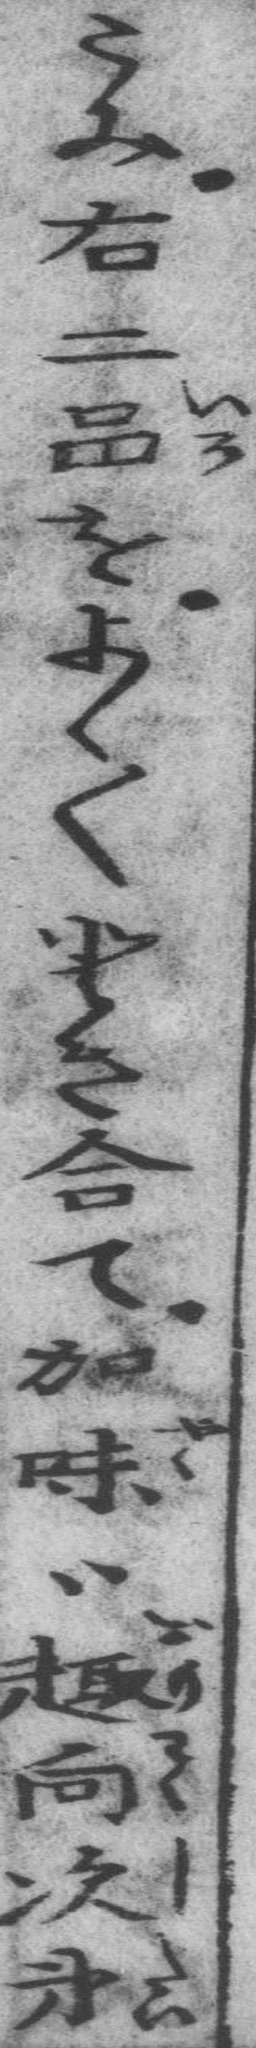こみ。右二品を。よく〳〵とき合て。加味は趣向次第

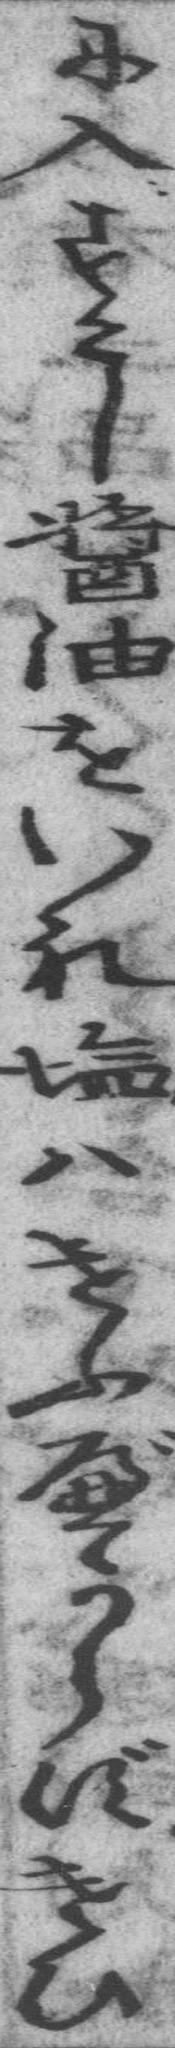に入。すこし醤油をいれ。塩は遣ふべからず。遣ひ
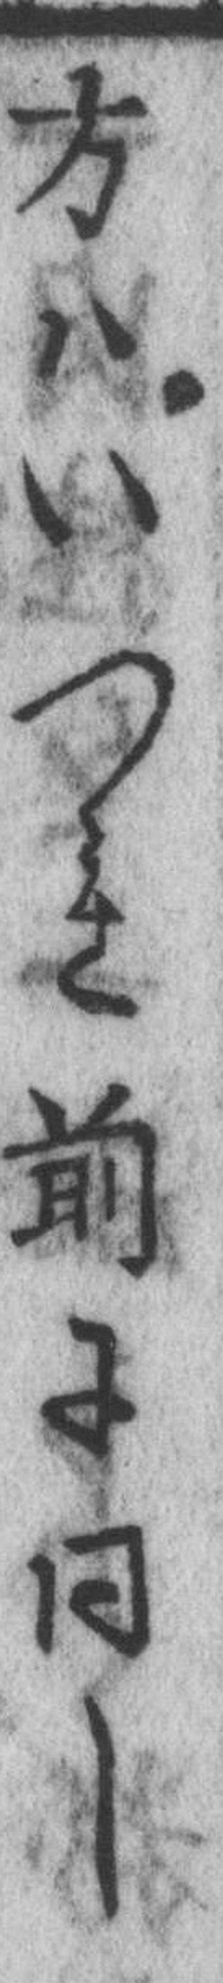方は。いつれ前に同し
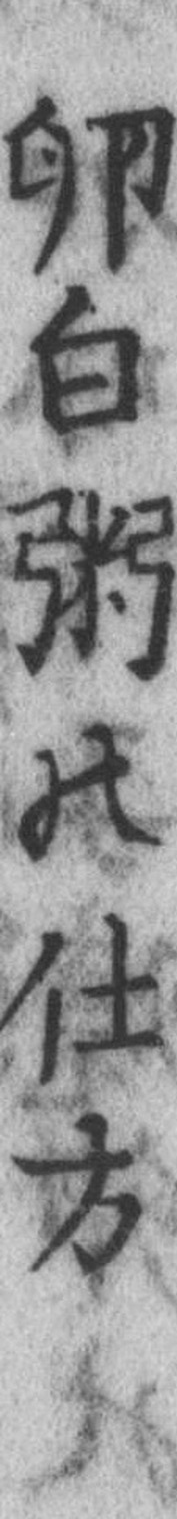卵白粥の仕方
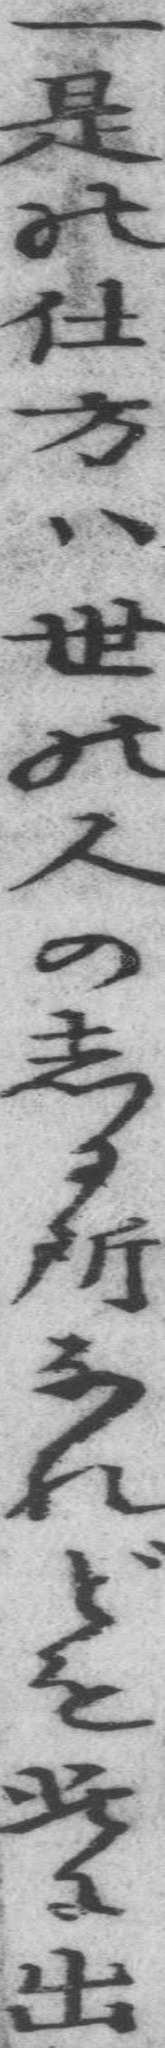一是の仕方は。世の人のしる所なれども。此に出
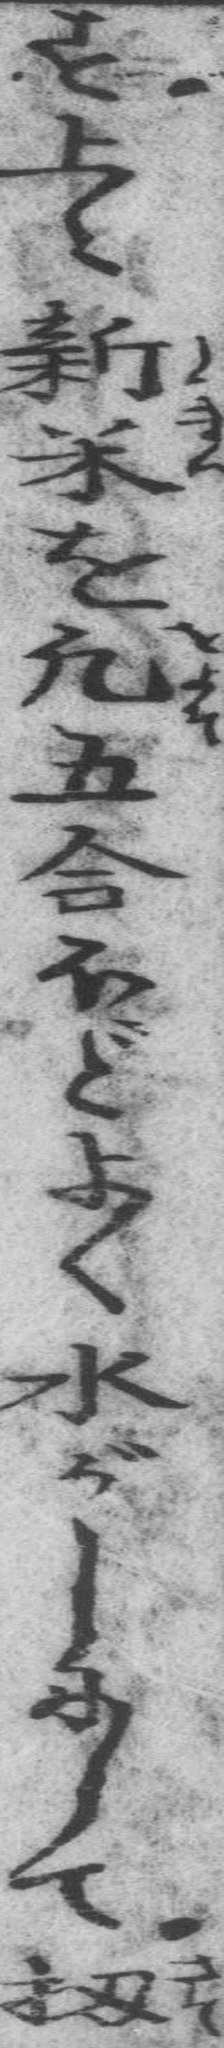す。上々新米を凡五合ほどよく水がしにして。扨
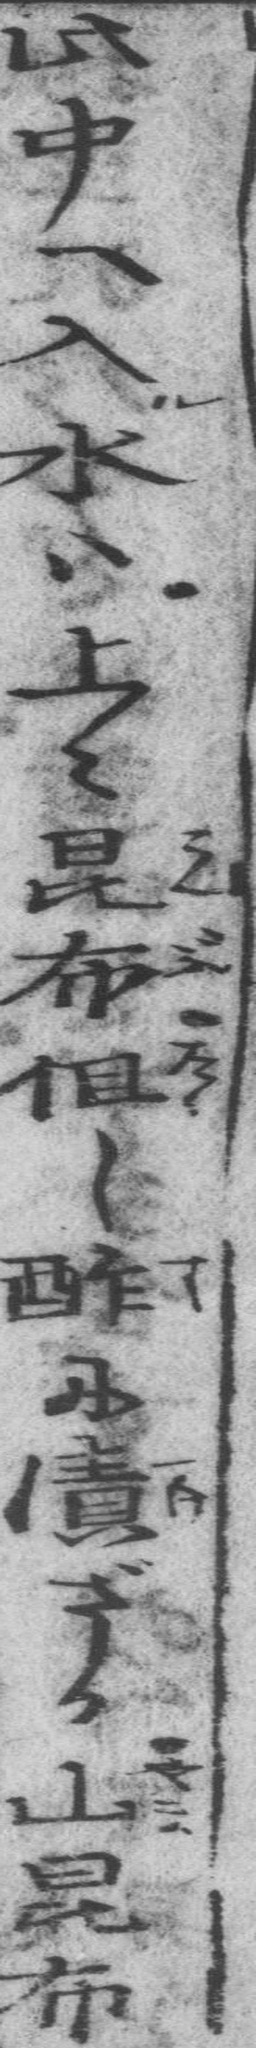此中へ入る水は。上々昆布。但し酢に漬ざる。山昆布
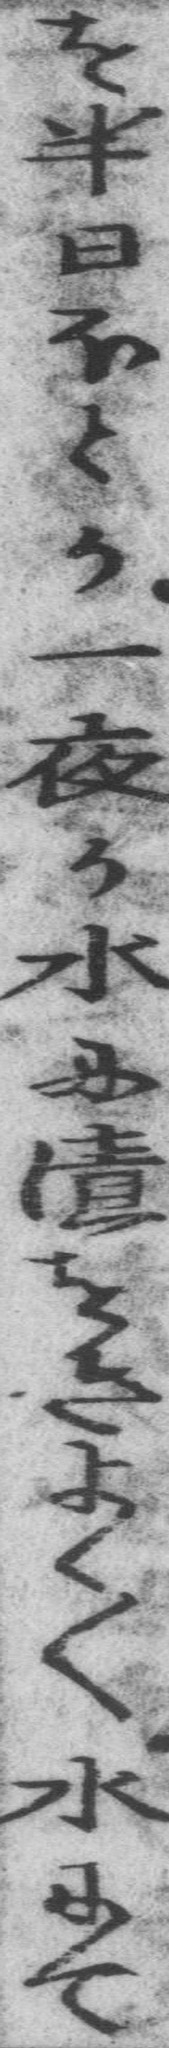を。半日ほとか。一夜か。水に漬をき。よく〳〵。水にて
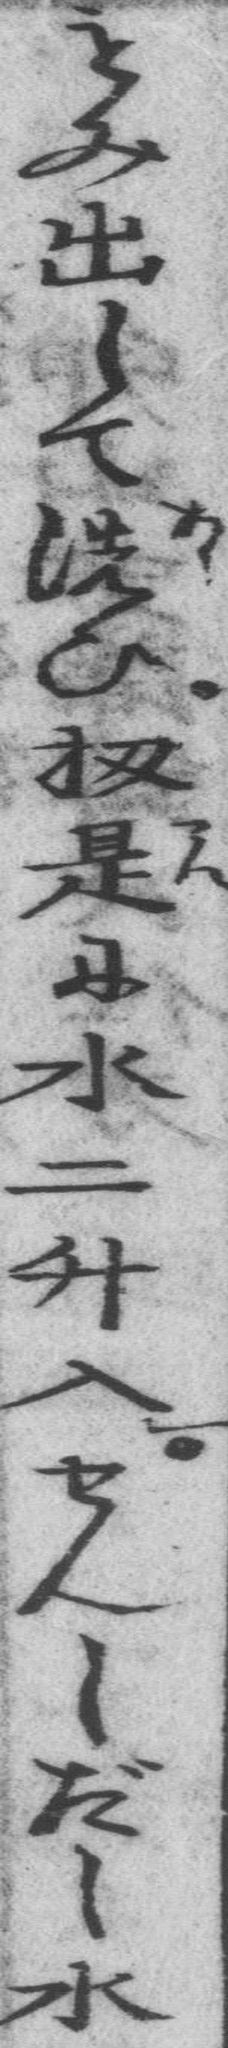もみ出して洗ひ。扨是に水弐升入れ。せんしだし水
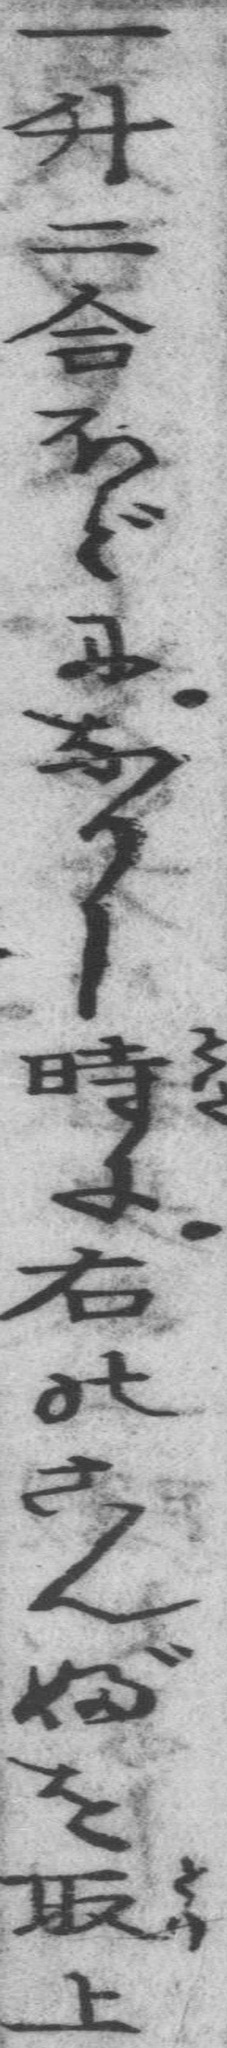一升二合ほどに。なりし時に。右のこんぶを取上
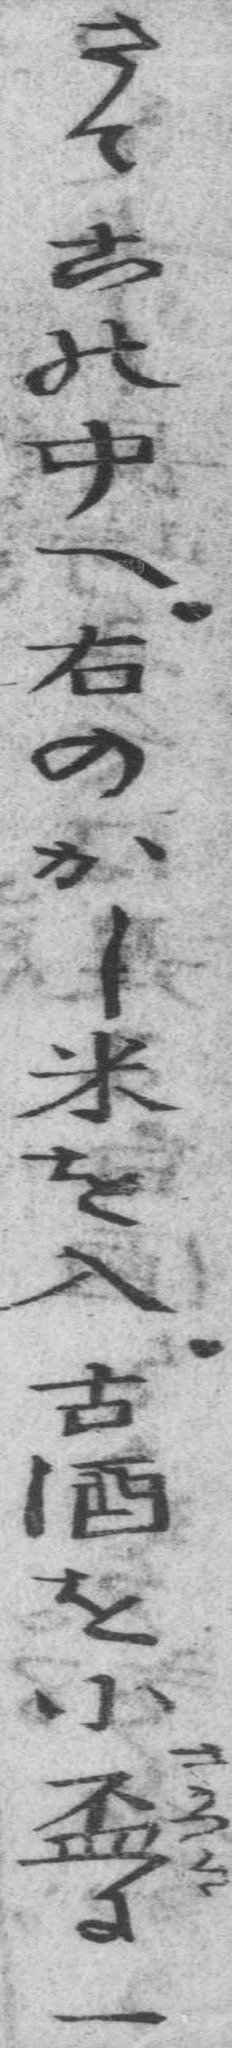さてこの中へ。右のかし米を入。古酒を小盃に一
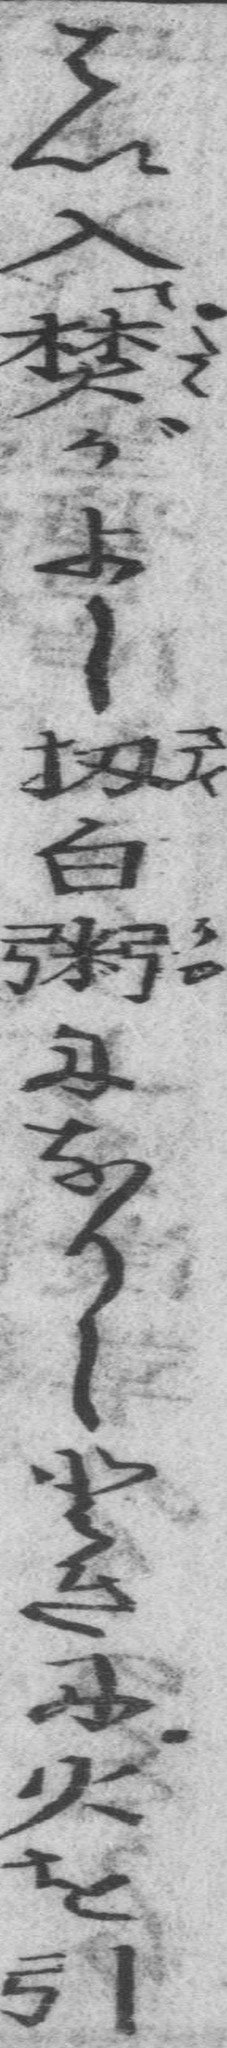はい入て。焚がよし扨白粥になりしときに。火を引
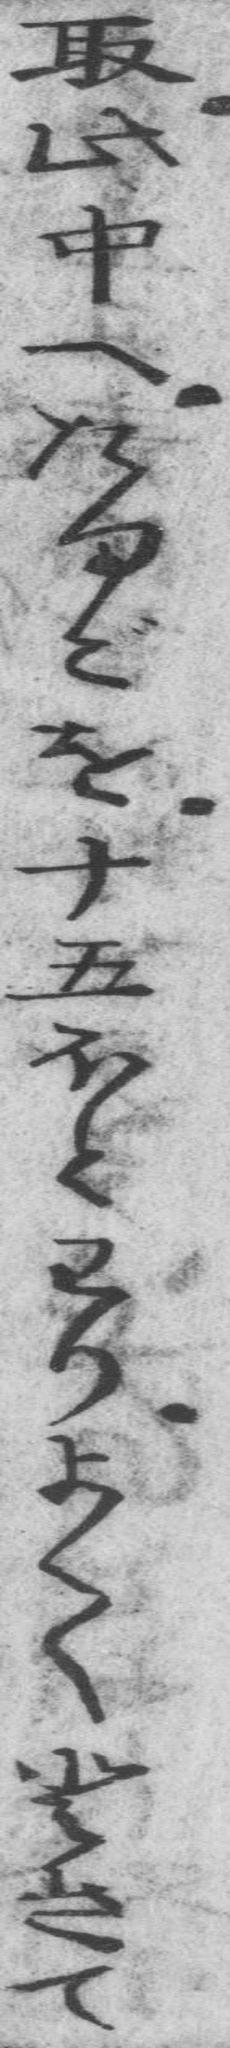取。此中へ。たまごを。十五ほとわり。よく〳〵ときて
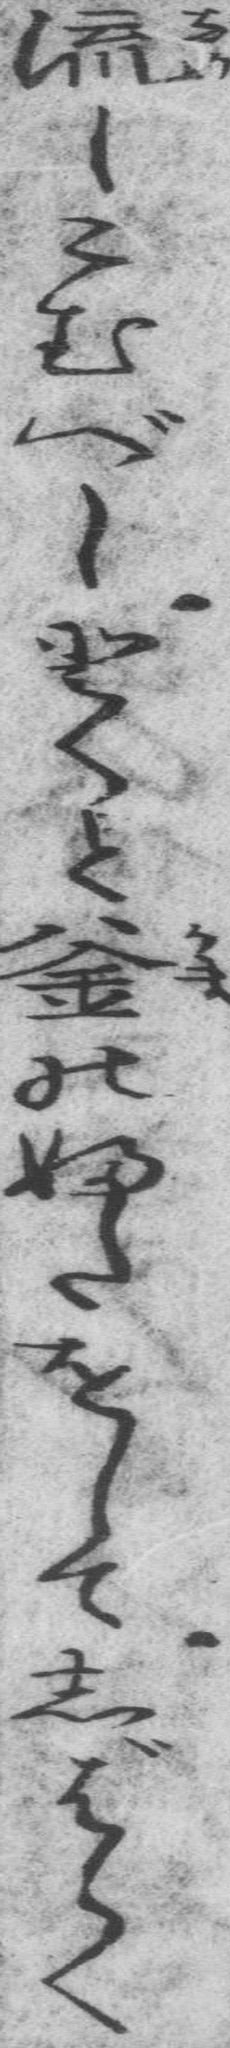流しこむべし。とくと釜のふたをして。しばらく
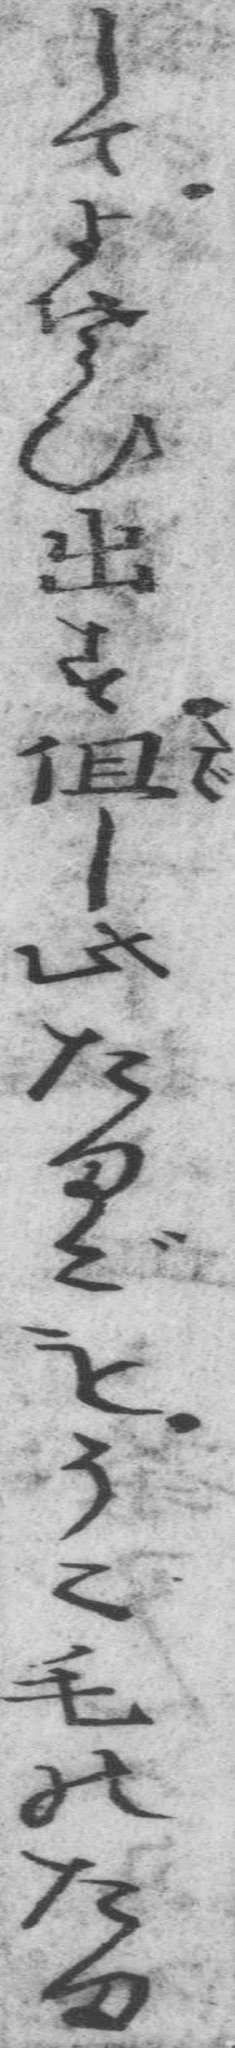して。よそひ出す。但し此たまごも。うこ毛のたま
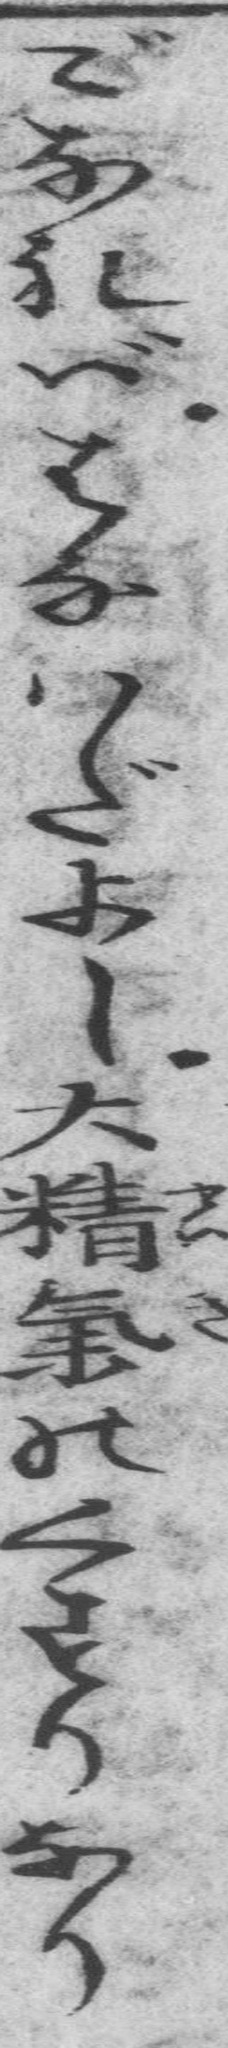ごなれば。はなはだよし。大精気のくすりなり
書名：萬寳料理秘密箱
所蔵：大阪府立大学学術情報センター 国文学研究資料館
